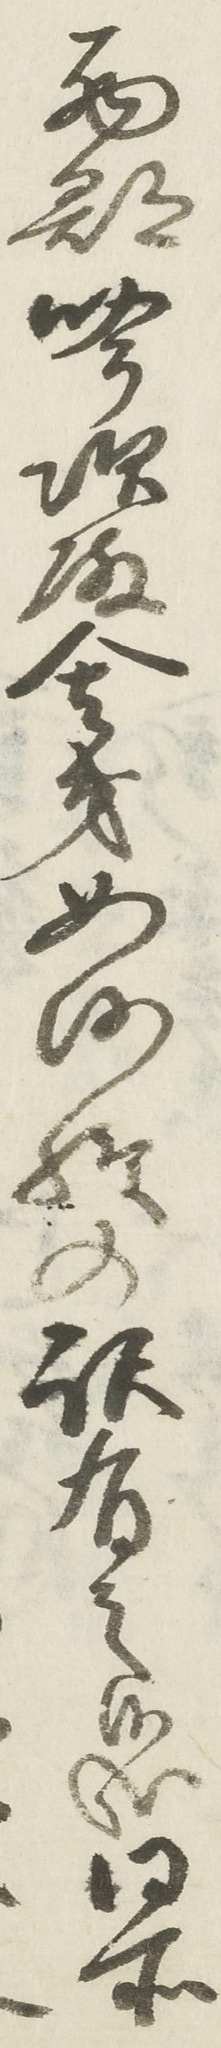西部吟次殿舎弟如何様の訳有之候哉同所
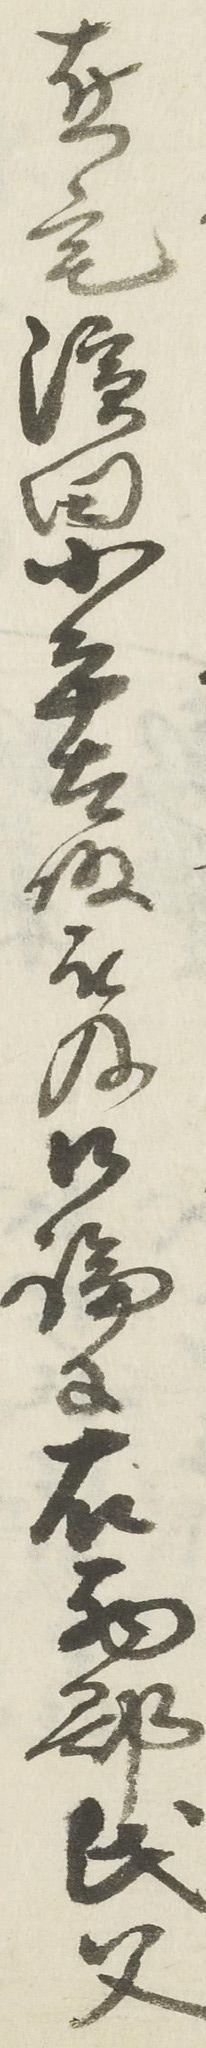在宅濱田小平太殿被及口論に右西部氏父
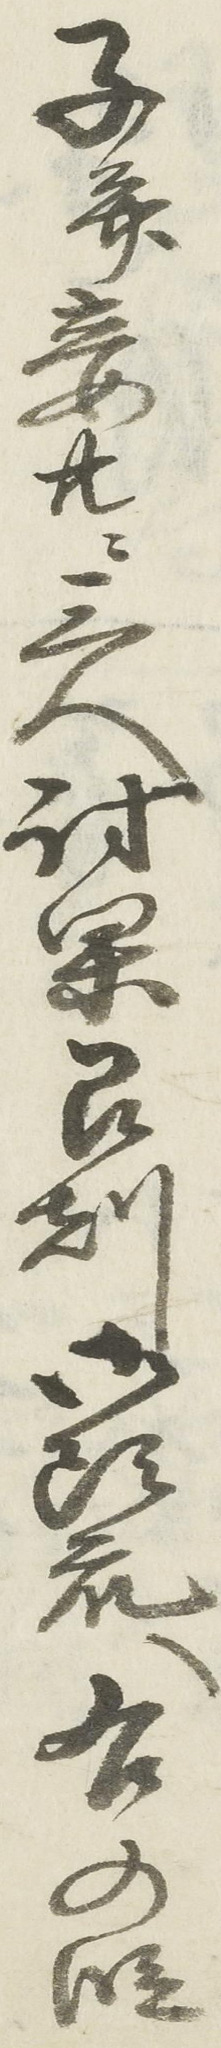子幷妾共ニ三人討果即刻御頭衆へ右の段
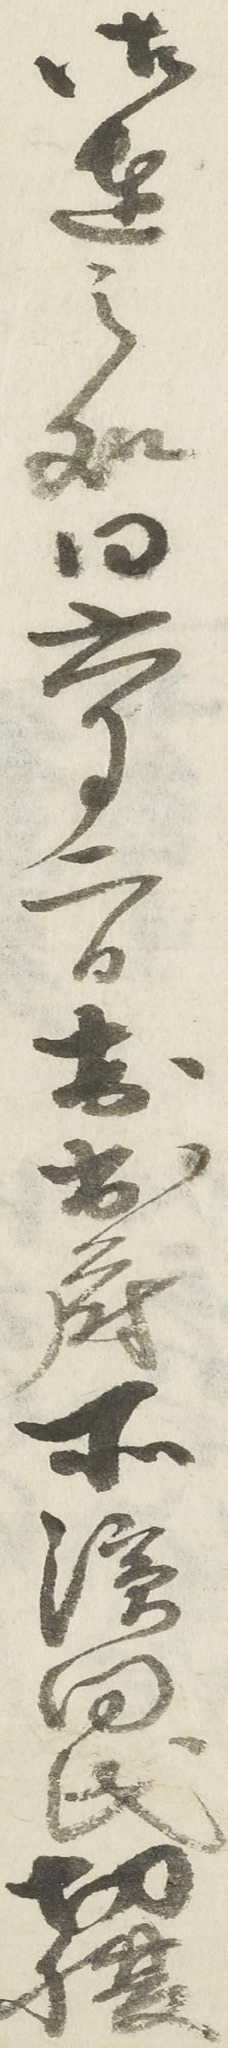御達之処同六月二日於出府所濱田氏切腹
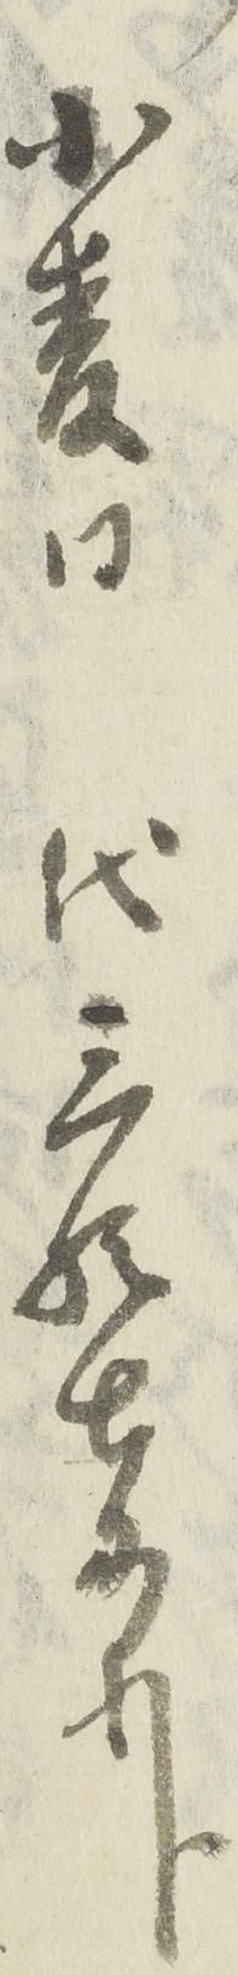小麦同代三拾七匁五分

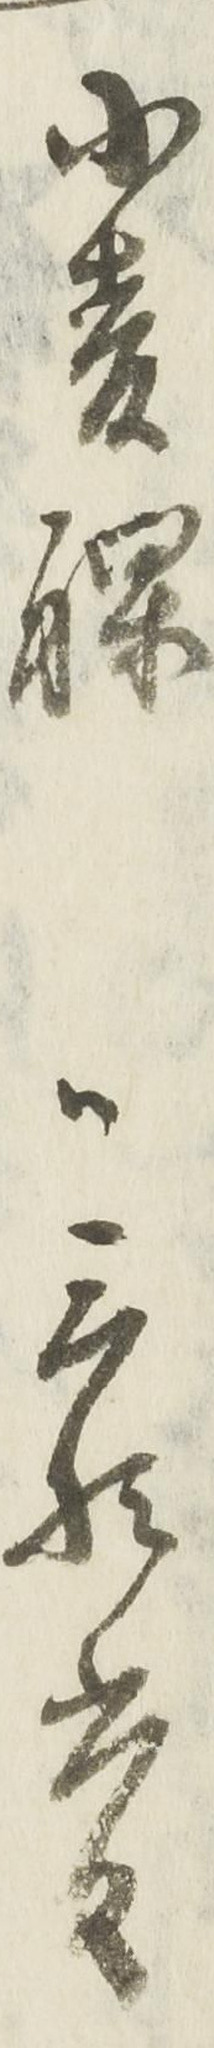小麦裸同三拾六匁
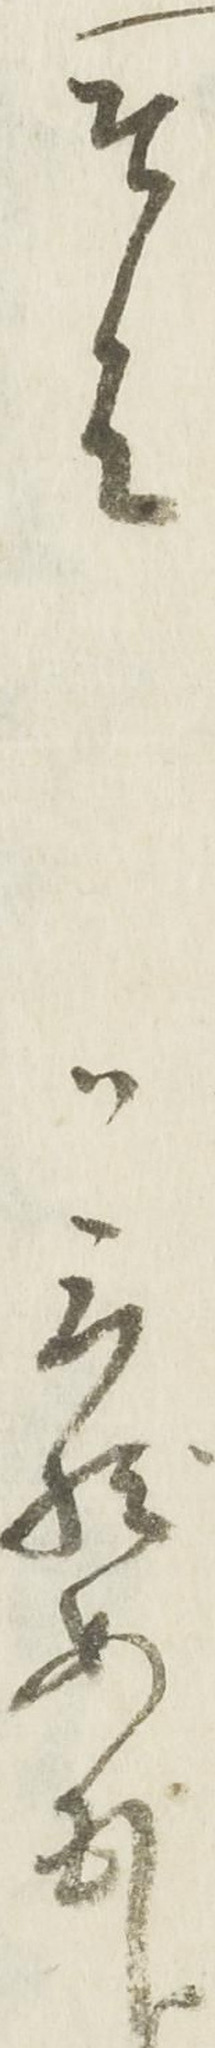そは同三拾め五分
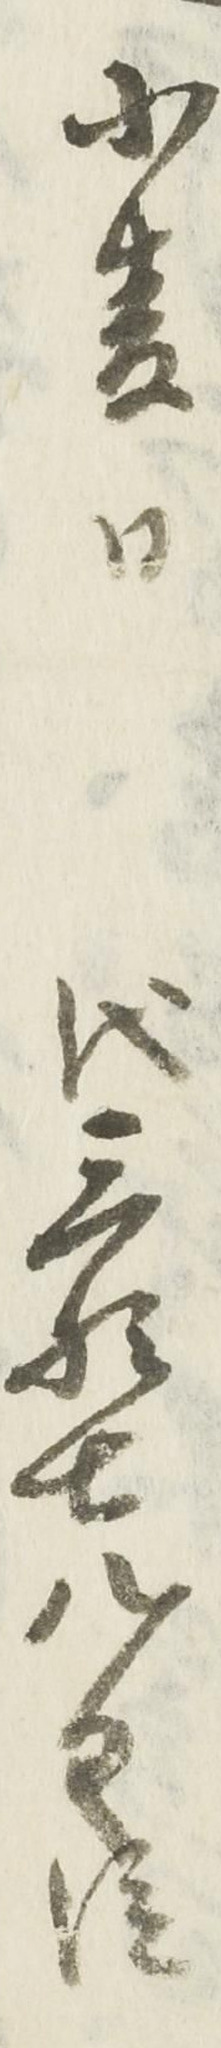小麦同代三拾七八匁位
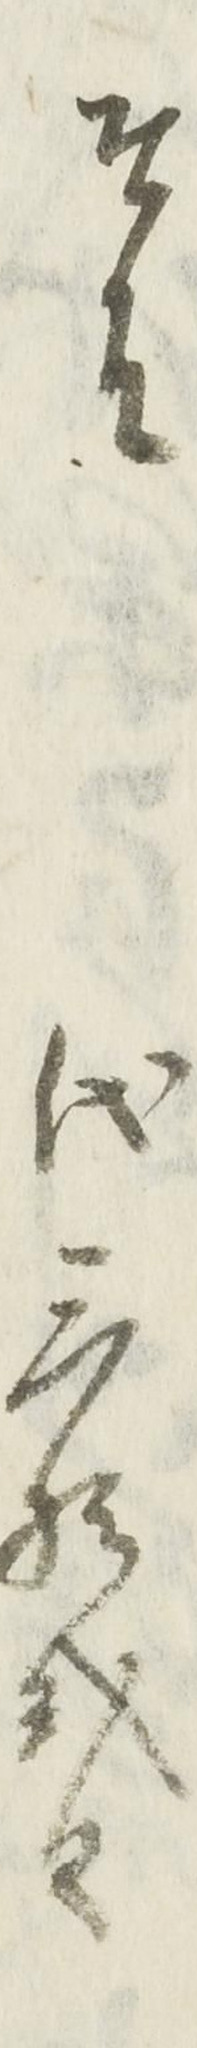そは代三拾弐匁
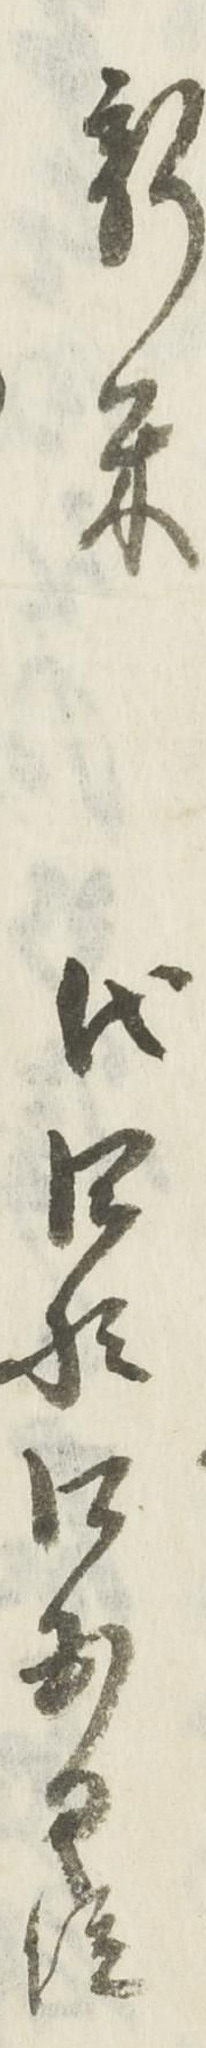新米代四拾四五匁位
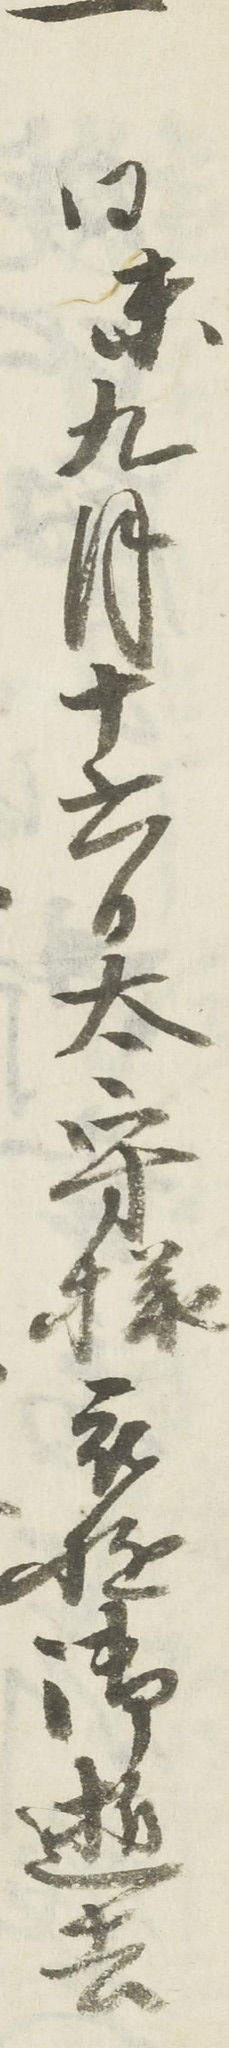一同未九月十六日太守様被遊御逝去
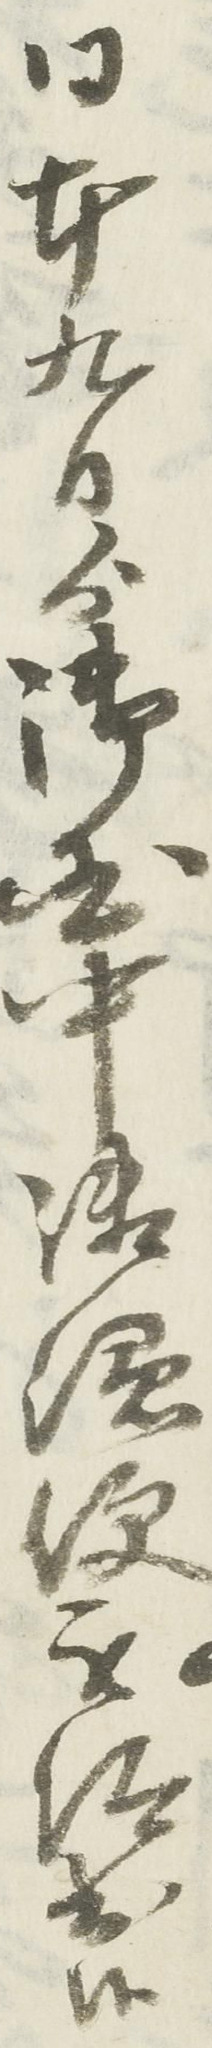同廿九日ゟ御国中御穏便被仰出候
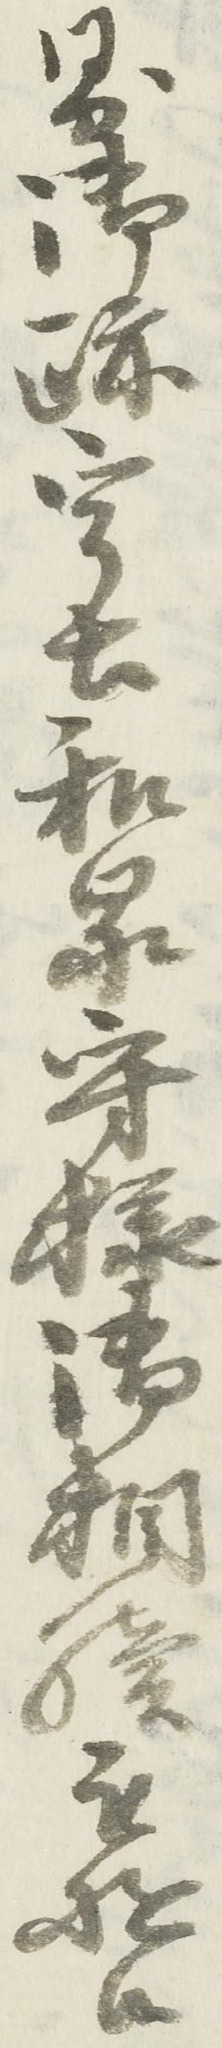同家御跡宇土和泉守様御相続被遊候
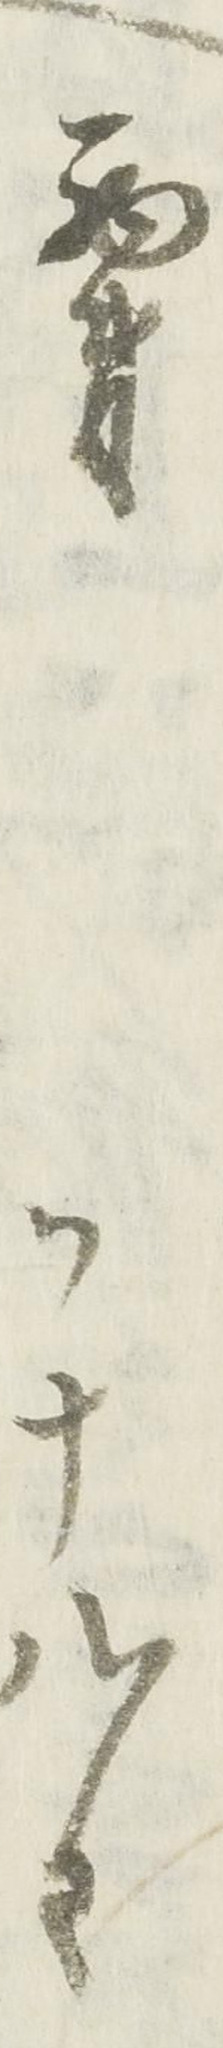粟同十八匁
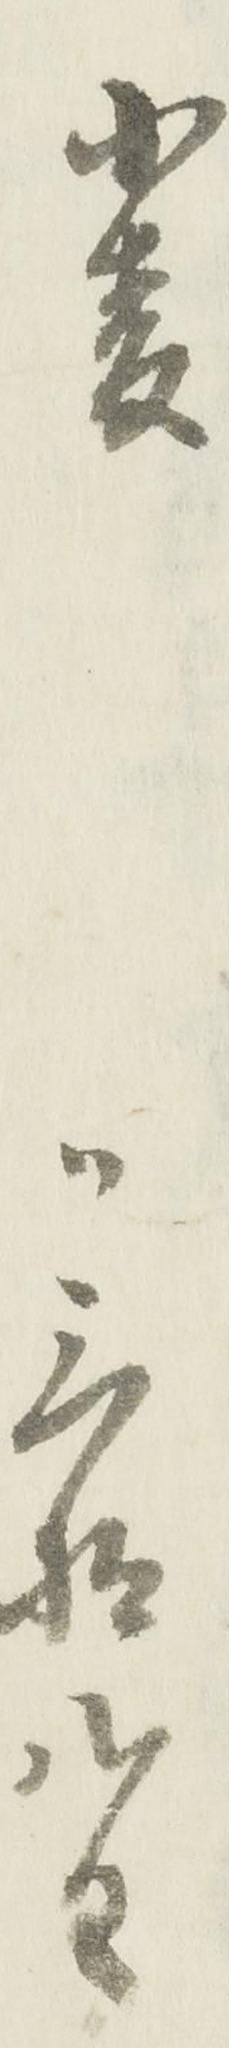小麦同三拾八匁
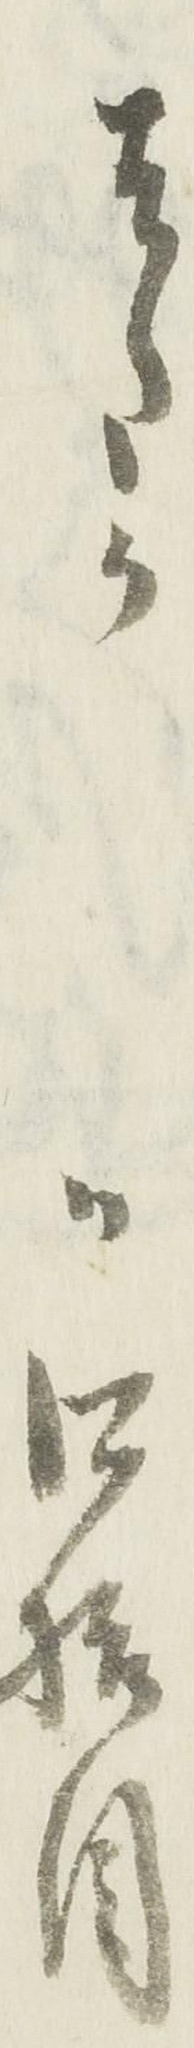はたか同四拾目
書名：後見笑
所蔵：東京大学地震研究所図書室 Earthquake Research Institute Library, The University of Tokyo, JAPAN
